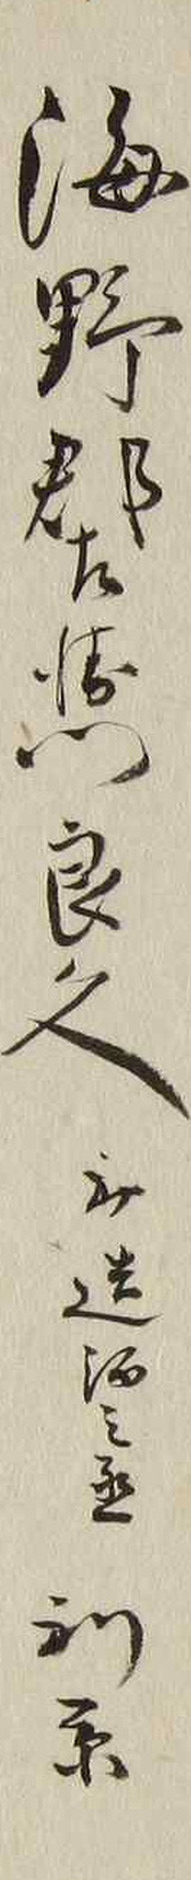海野郡左衛門良久初造酒之丞別系
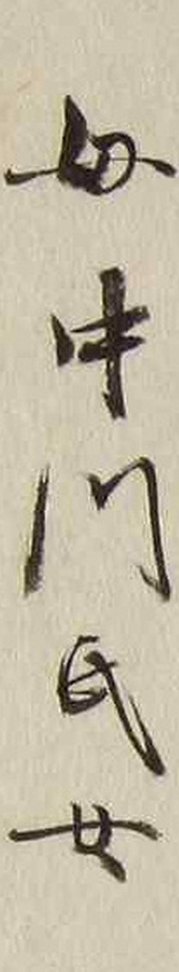母中川氏女

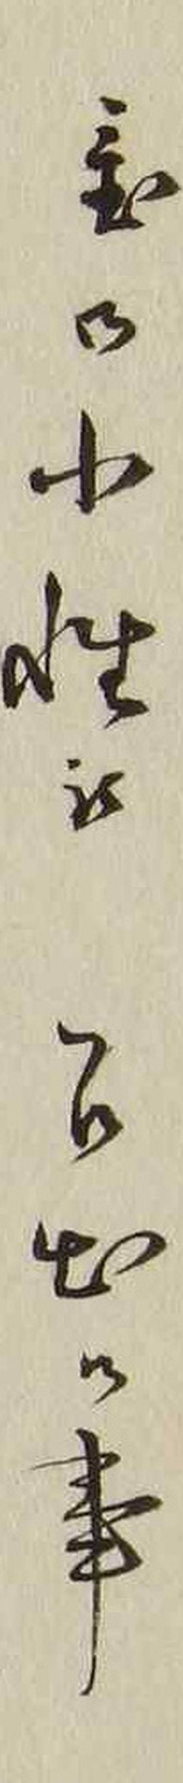置御小性被召出候事
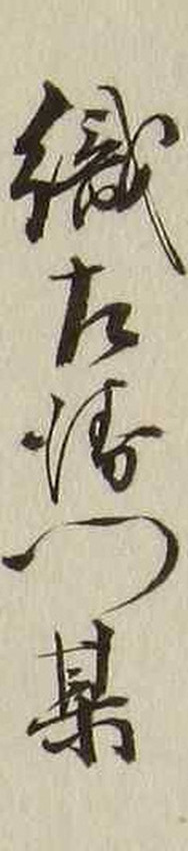織左衛門某
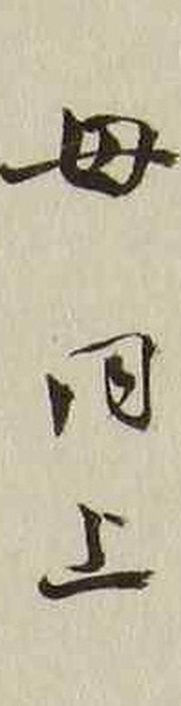母同上
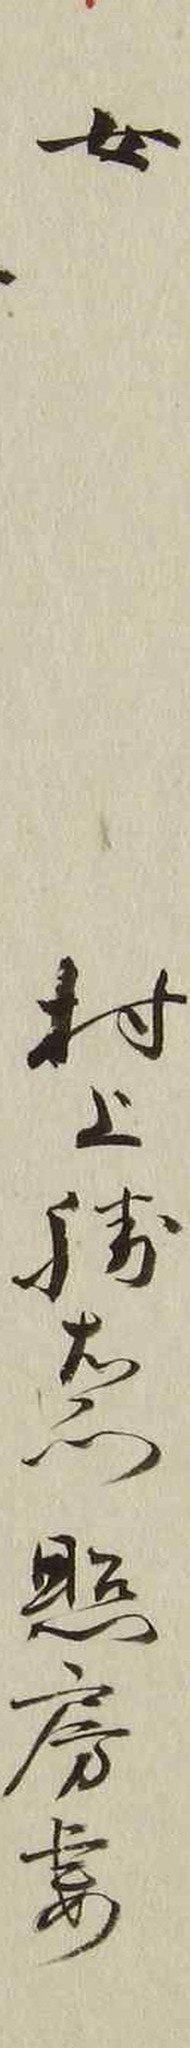女村上勝右衛門照房妻
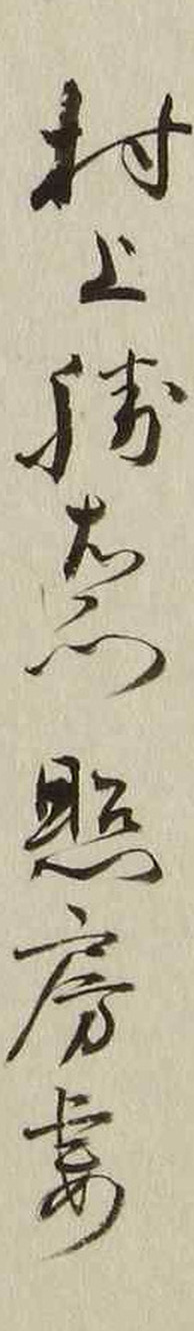女村上勝右衛門照房妻
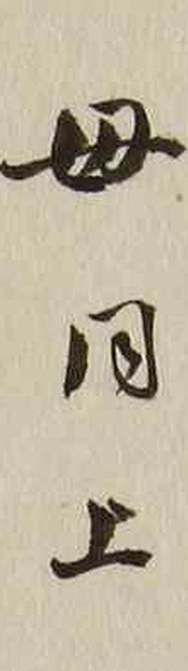母同上
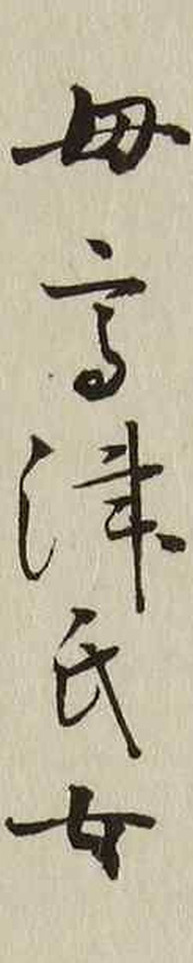母高津氏女
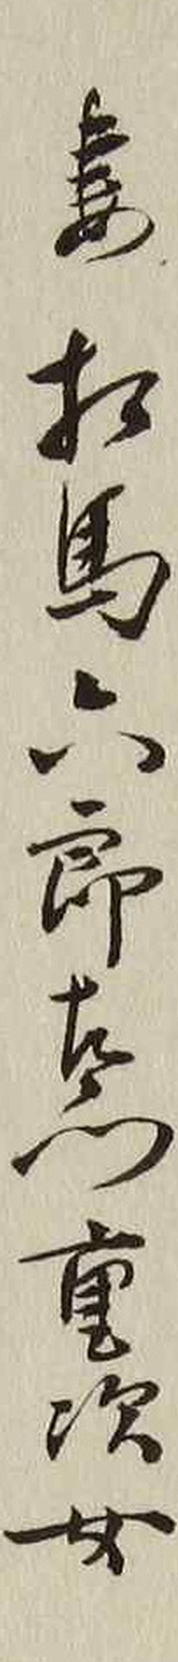妻相馬六郎左衛門重次女
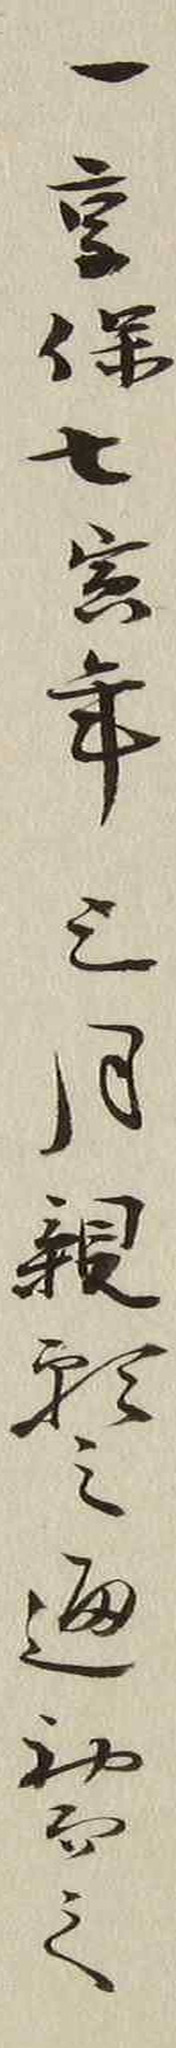一享保七寅年三月親願之通初而之
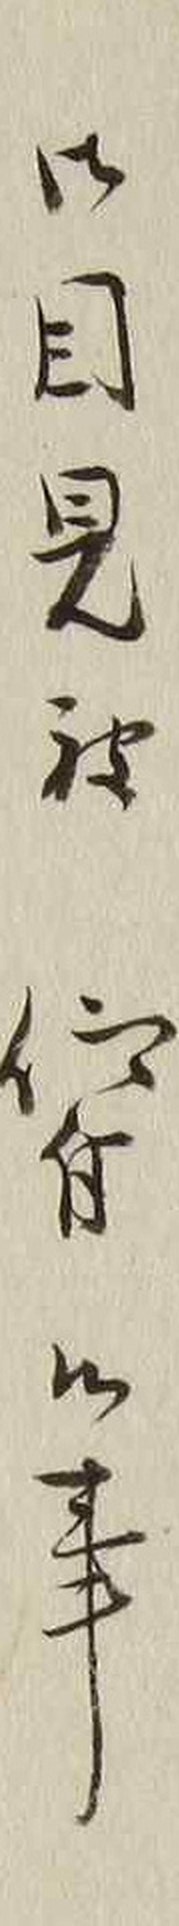御目見被仰付候事
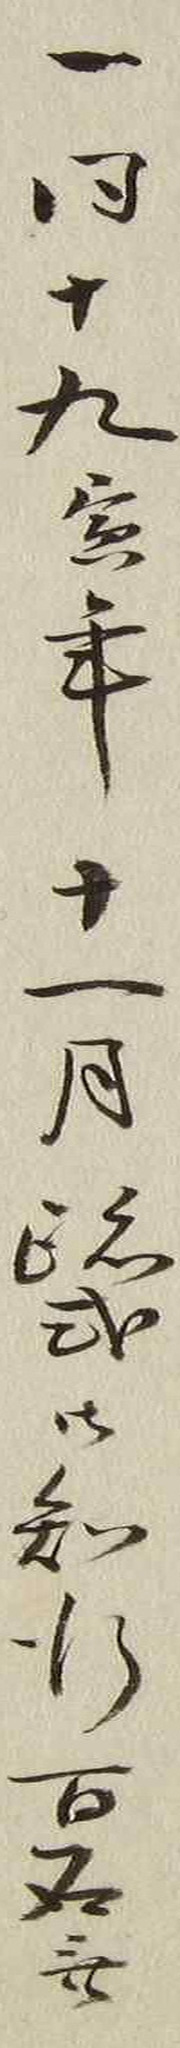一同十九寅年十一月跡式御知行百石無
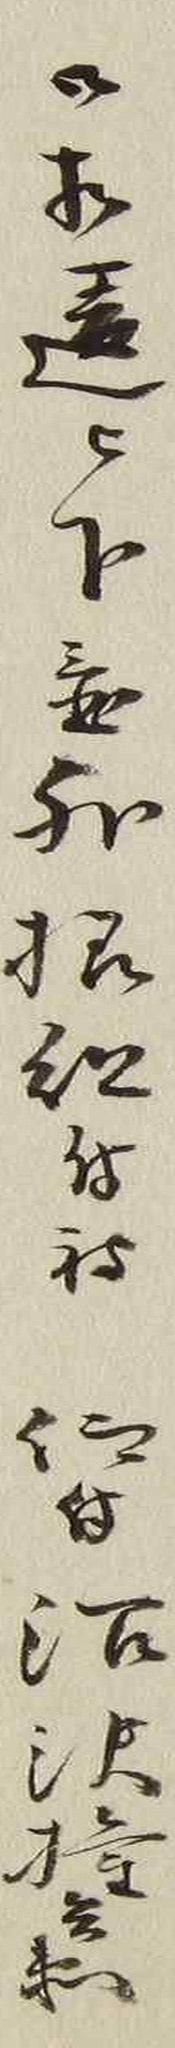御相違被下置外様組付被仰付沼沢権兵衛
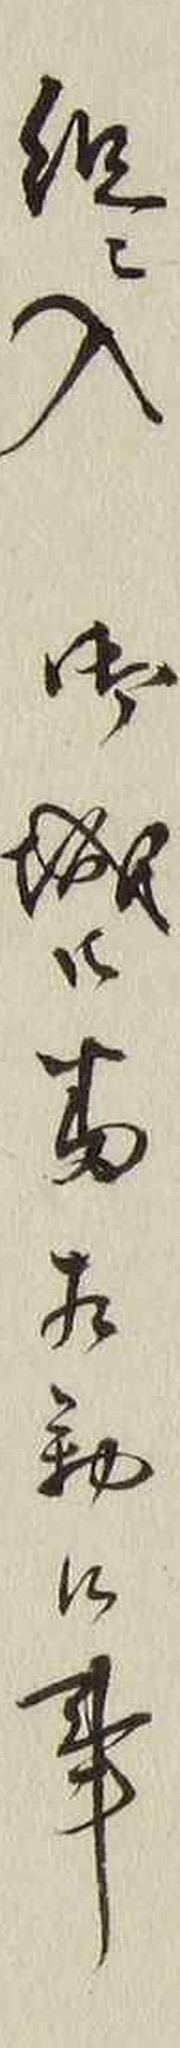組に入御城御番相勤候事
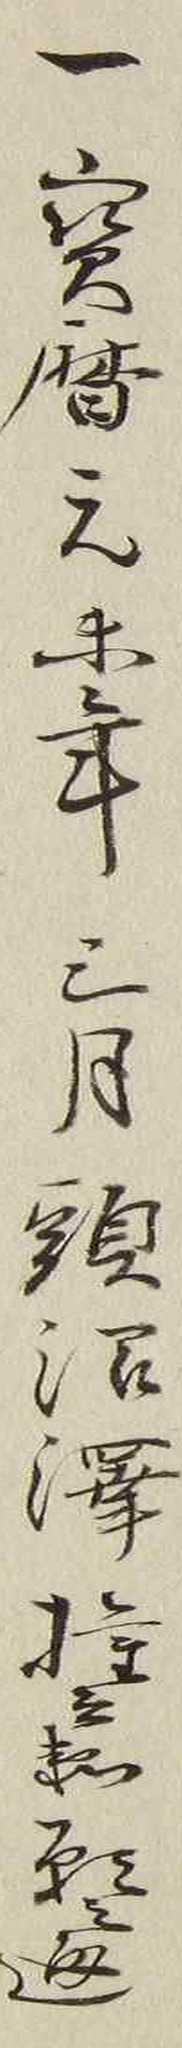一宝暦元未年三月頭沼沢権兵衛願之通
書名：諸士系譜　巻之157　ね之部1
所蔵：会津若松市立会津図書館
